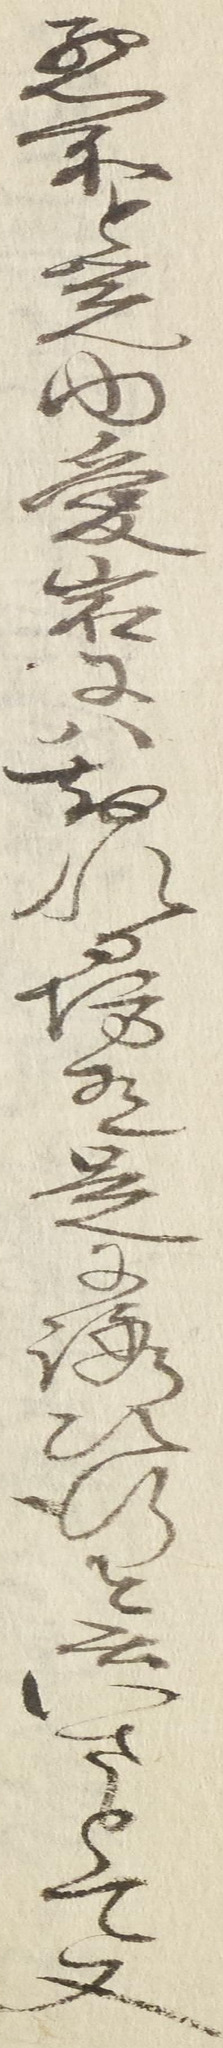悪所と覚ゆ愛宕には知れる坊有是に誘ひ行と云いさとて又
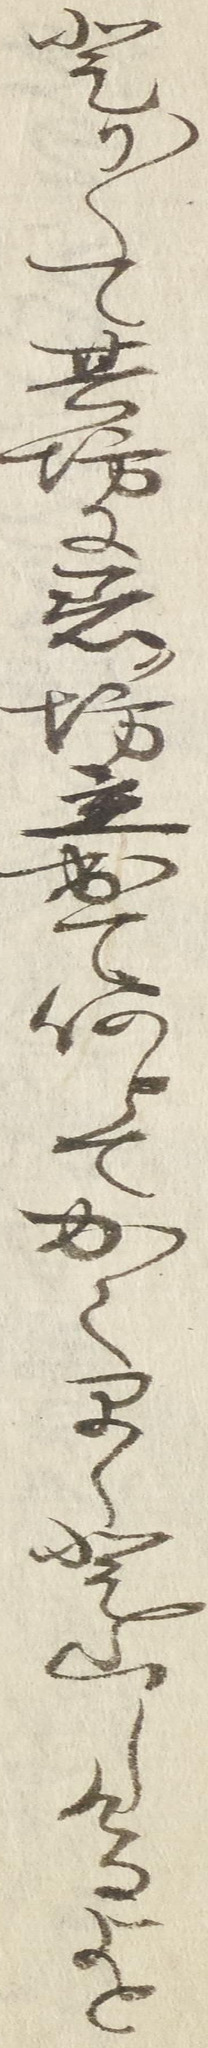登り〳〵て其坊に着く坊主出て何とてかく早く登山しけるよと
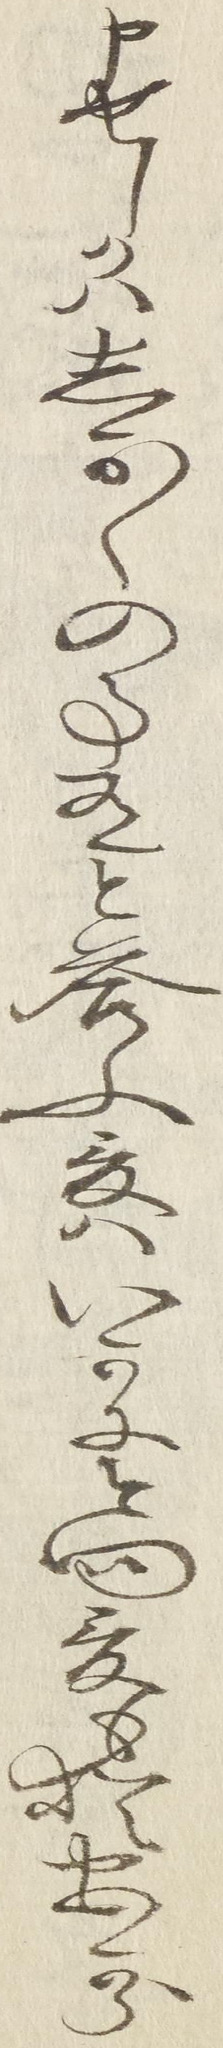申せしかはしか〳〵の事有と答ふ爰はいかにと問爰も猶安から
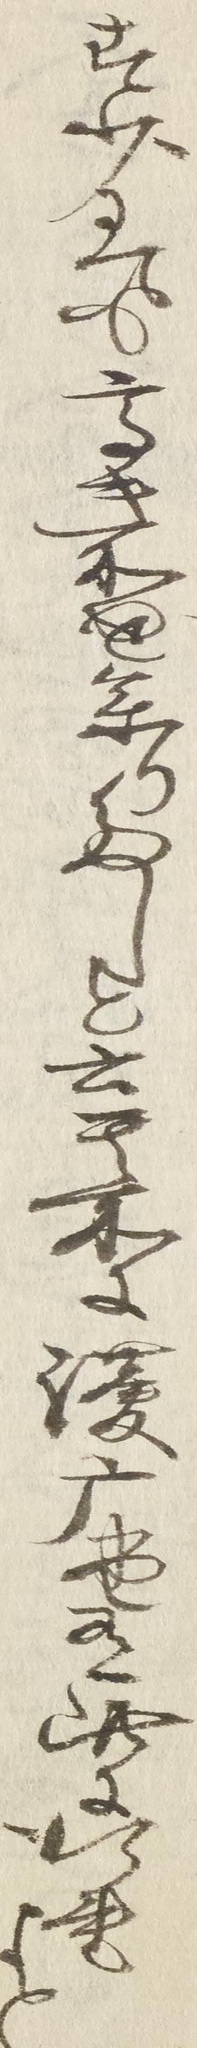す少にても高き所へ参りたしと云其所に護摩堂あり此に行れよと
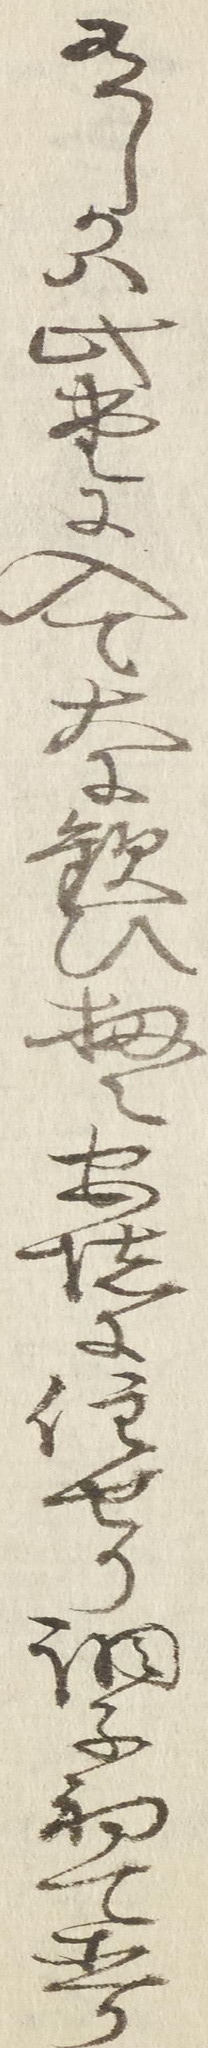ありしかは此堂に入て大に歓ひ扨々安堵に住せり調子初て直り
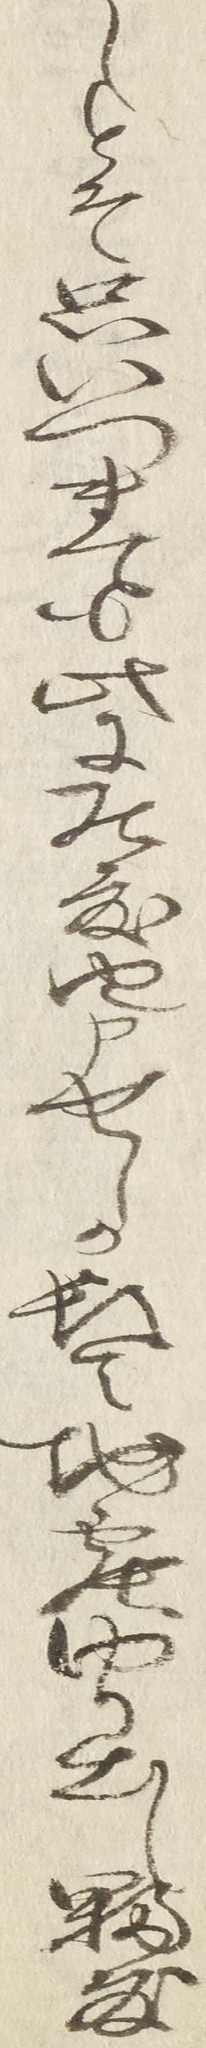しとて只いつまでも此に居度由申せしか頓て地震ゆり出し夥敷
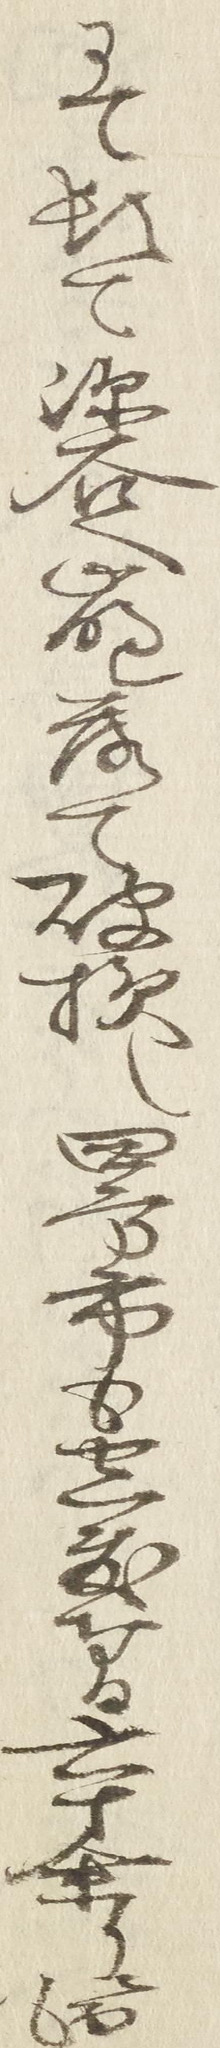頓て深谷へ崩れ落て破損し四方市も空敷なる六十余りにても
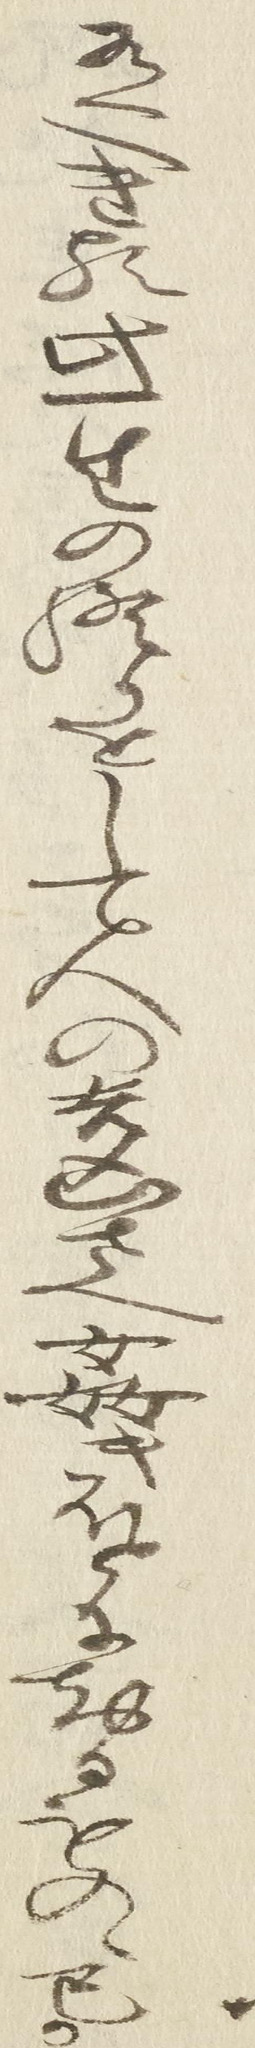有べき歟此一生の終りをして人の吉凶さへ姦きほどに知るものゝ己か
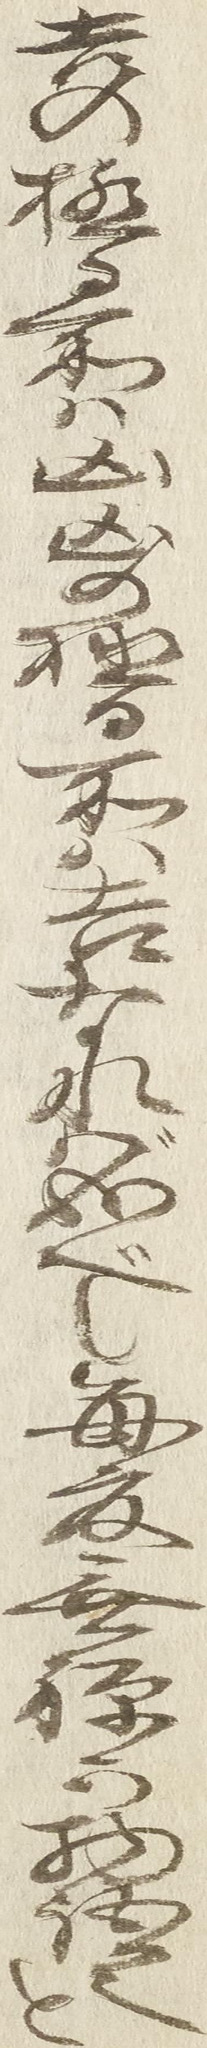吉の極る所は凶凶の極る所は吉なれは成べし毎度無禅か物語也と
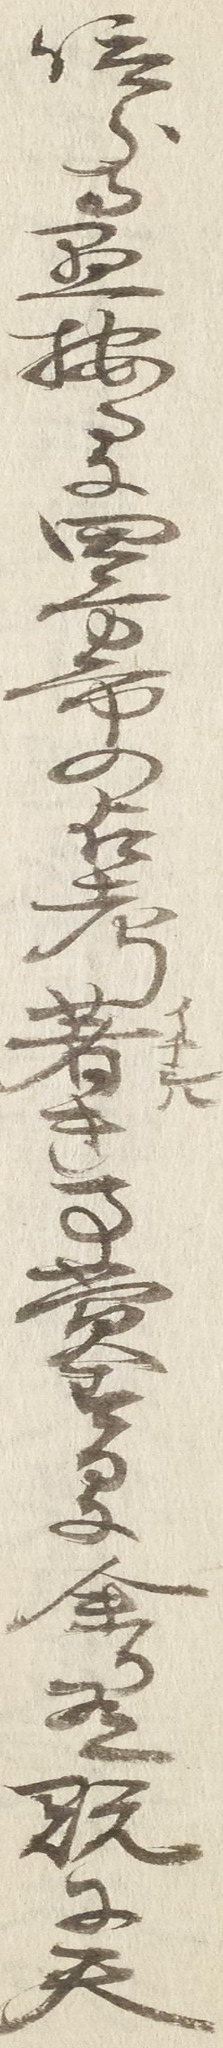仰らる愚按るに四方市の占考著き事賞するに余り有既に天
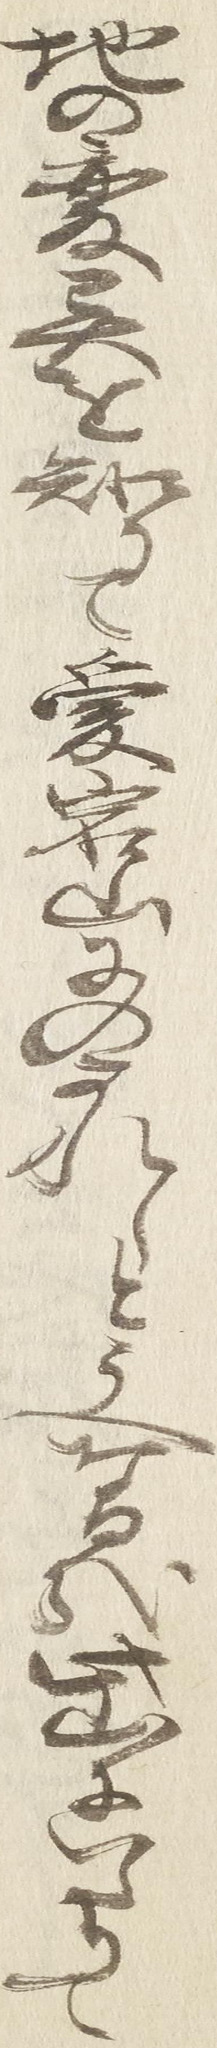地の変異を知りて愛宕山にのかれしとうへなる哉此山にいたりて
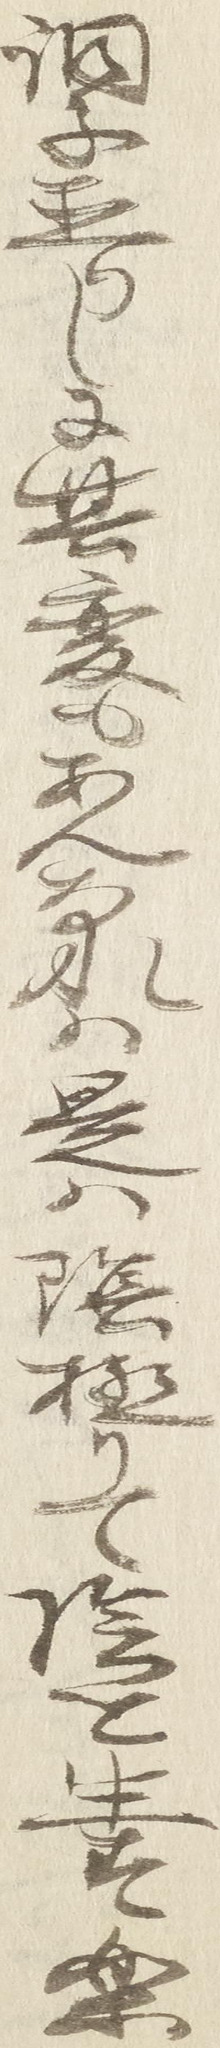調子直りしに其変もあんなれは是は陰極りて陽を生す楽
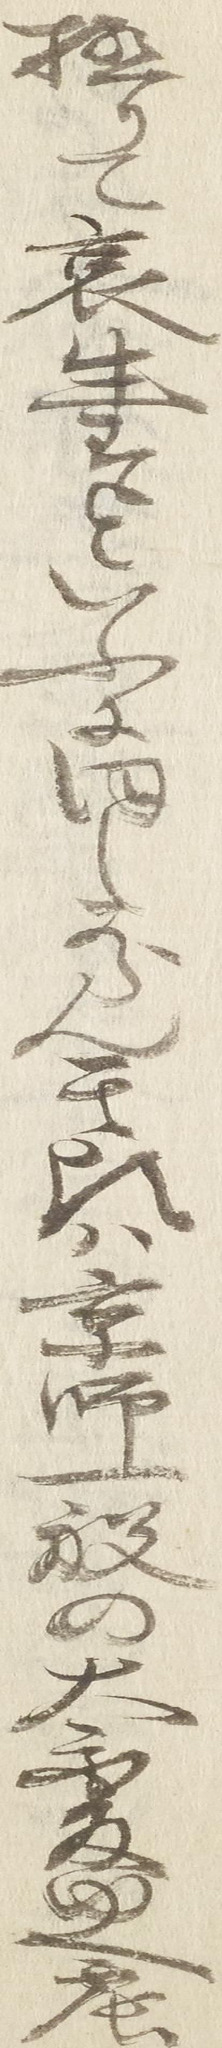極りて哀生ずといふに同じからん其頃は京師一般の大変ゆへ震
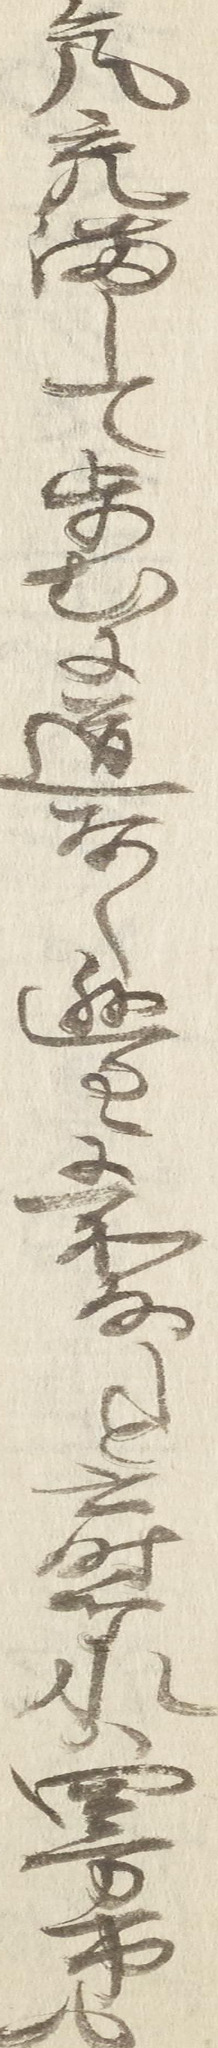気充満して歩むに道なく逃るに所なしと云時なれは四方市も
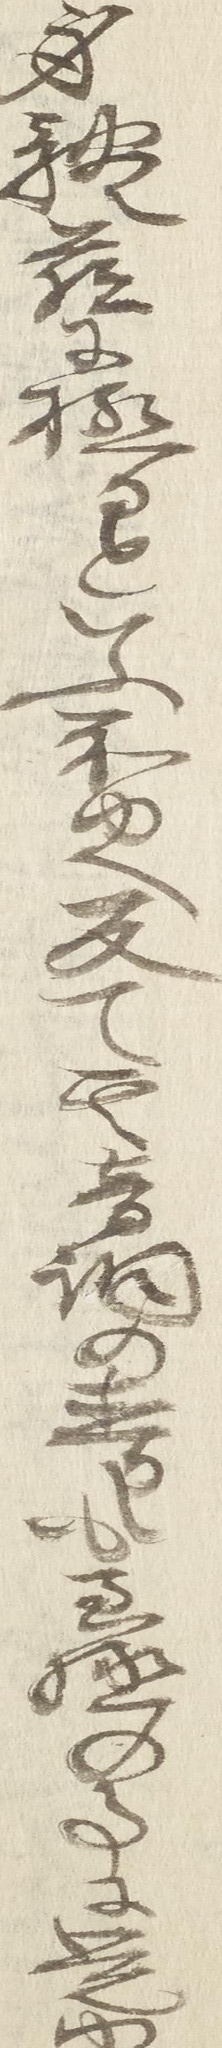身体茲に極るといふ所ゆゑ反て其音調の直りしも至極の事に覚ゆ
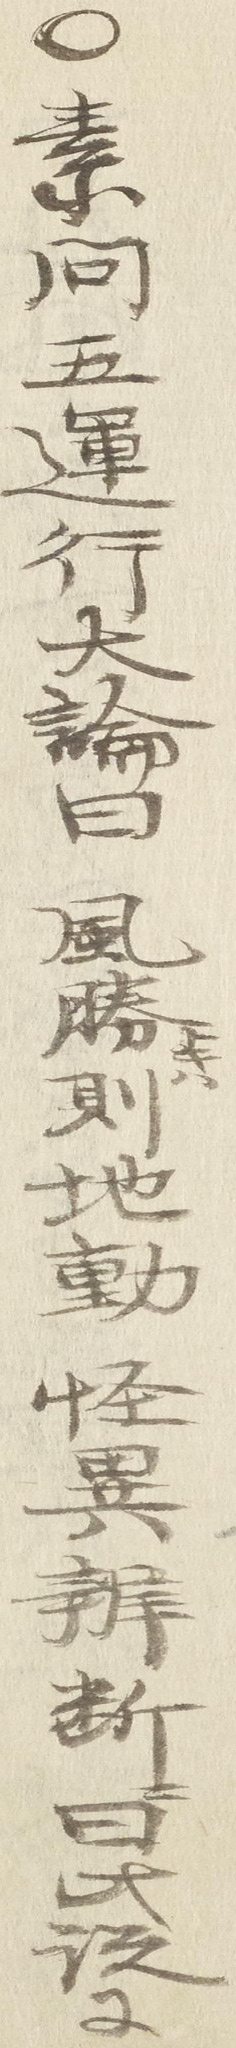〇素問五運行大論曰風勝ときは則地動怪異弁断に曰此説に
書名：地震記　下
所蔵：東京大学地震研究所図書室 Earthquake Research Institute Library, The University of Tokyo, JAPAN
